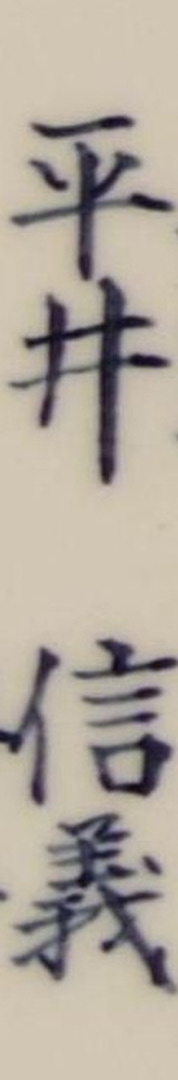平井信義

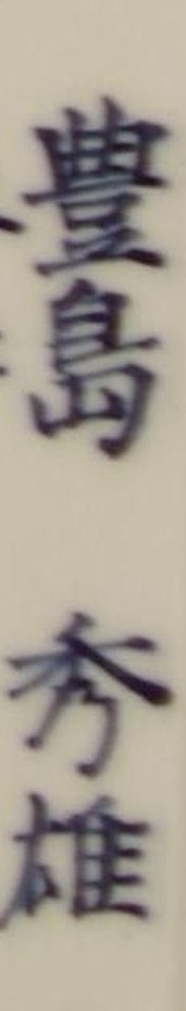豊島秀雄
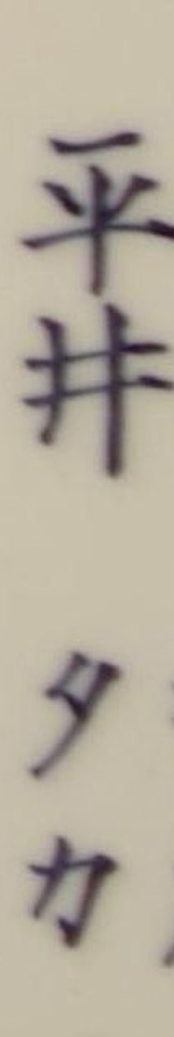平井タカ
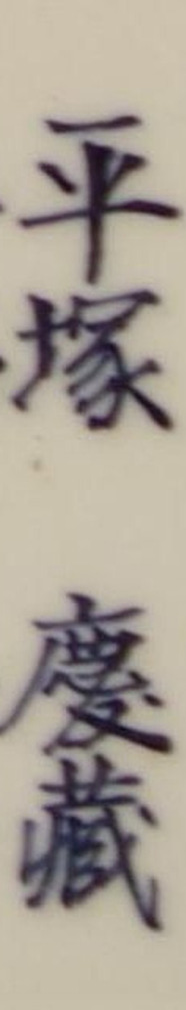平塚慶蔵
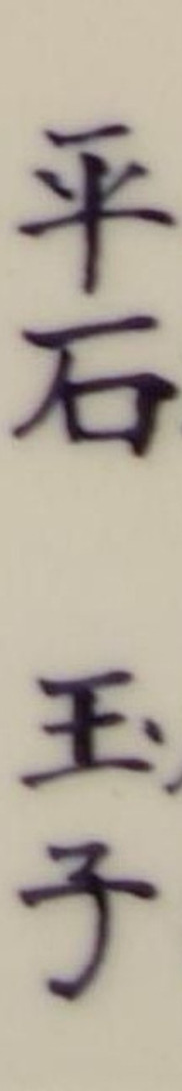平石玉子
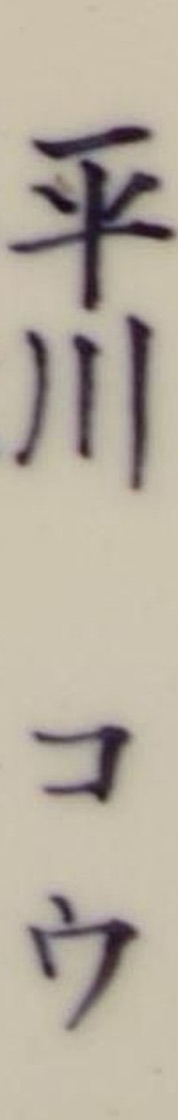平川コウ
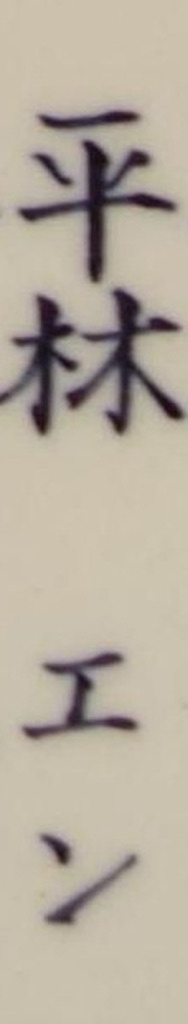平林エン
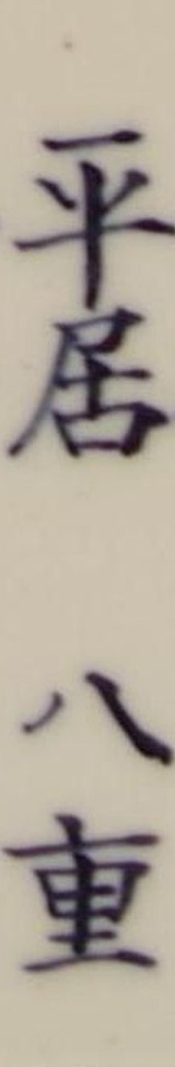平居八重
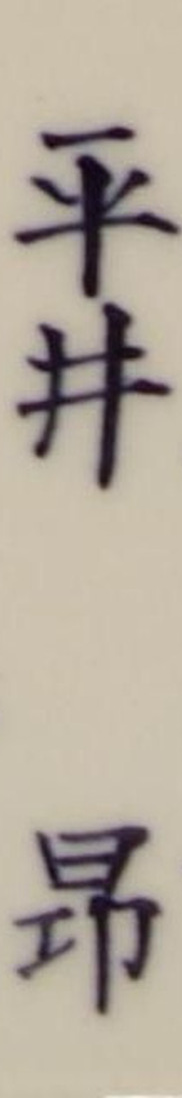平井昴
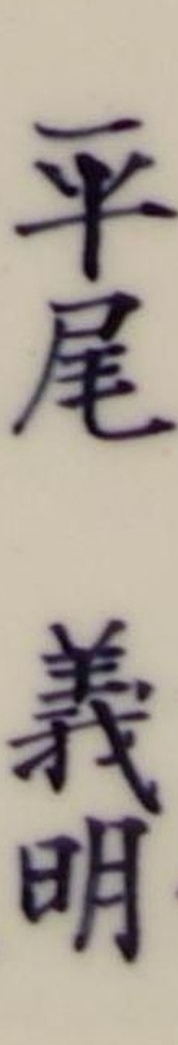平尾義明
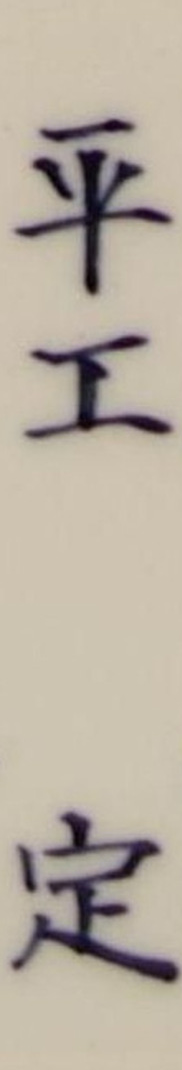平工定
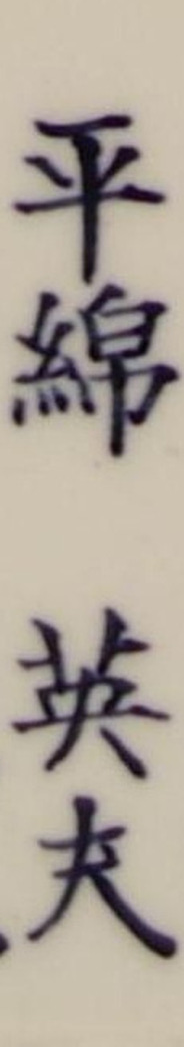平綿英夫
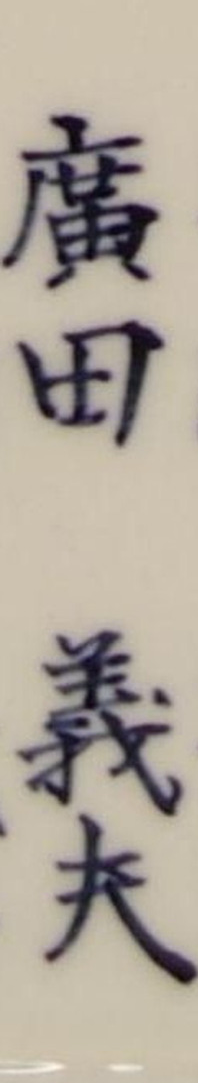廣田義夫
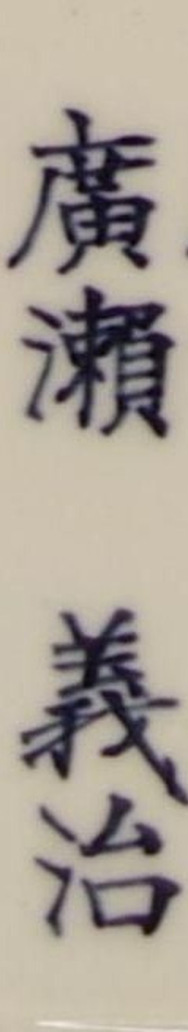廣瀬義治
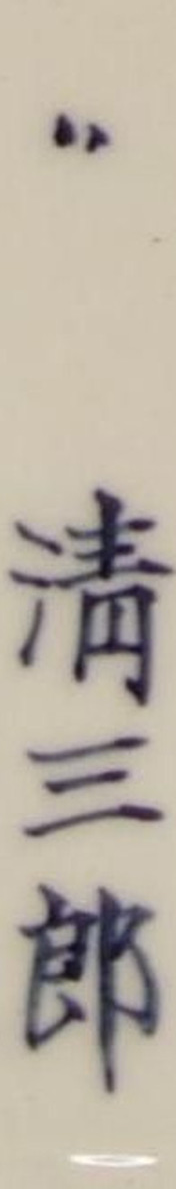清三郎
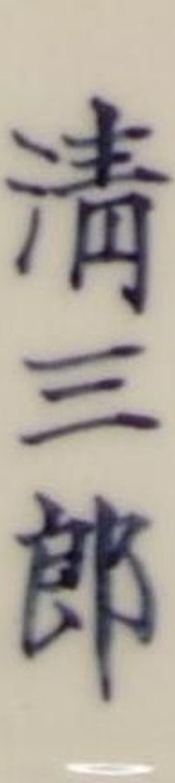清三郎
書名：E~L
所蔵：高野山金剛峯寺
